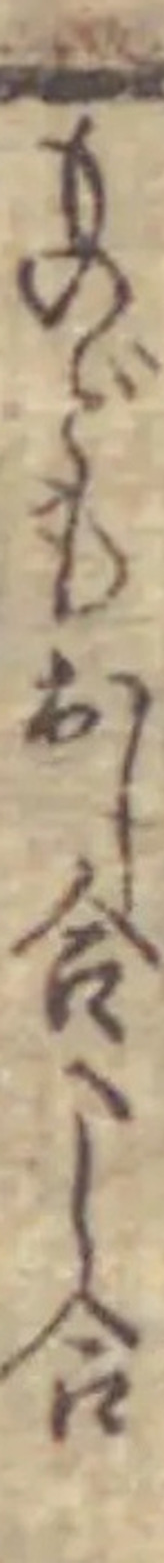ものどもおし合へし合
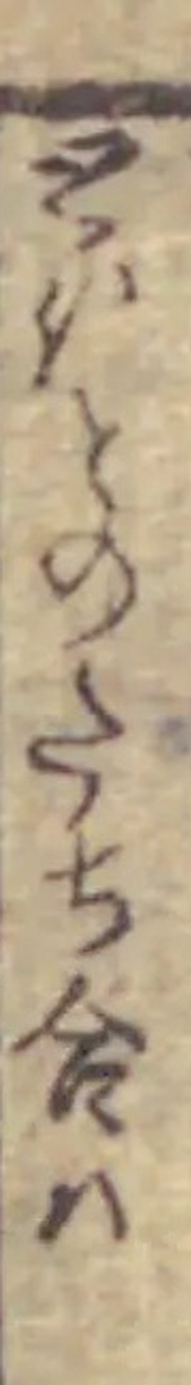ときとのたち合は
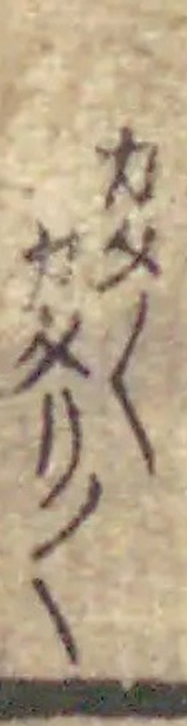カタ〳〵
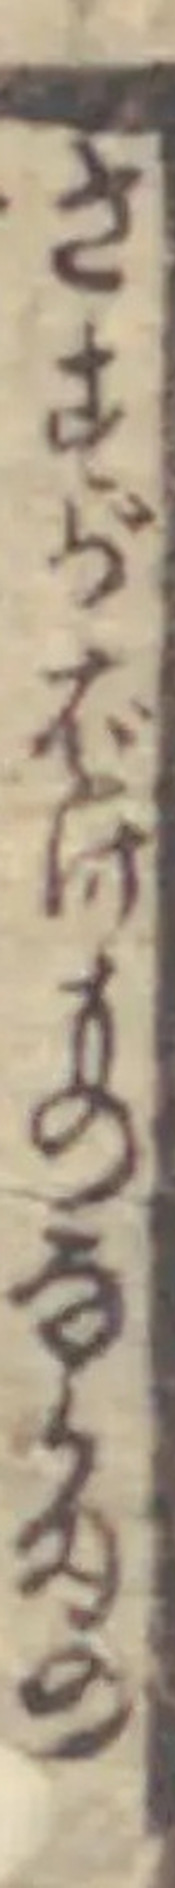さすがばけものなかまの
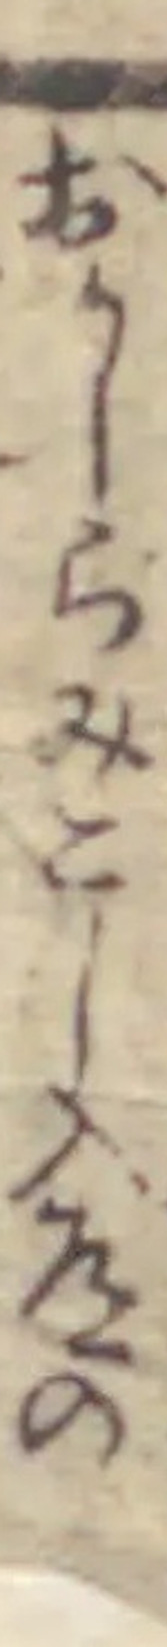おかしらみこし入道の
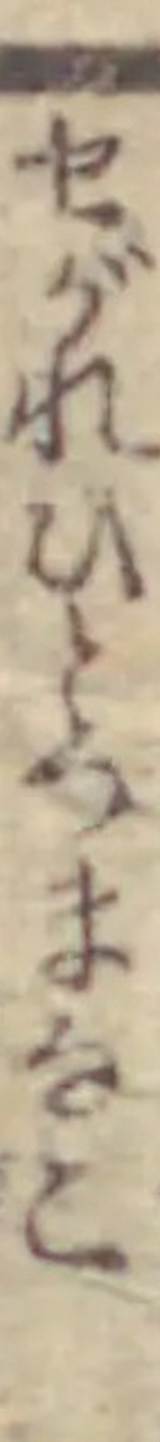せがれひとつまなこ
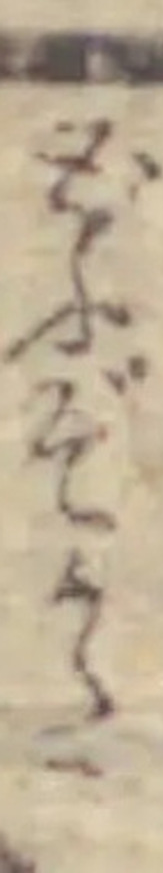どふぞかた
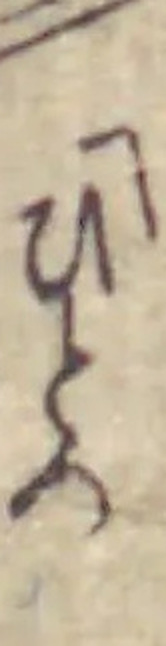〽ひとつ
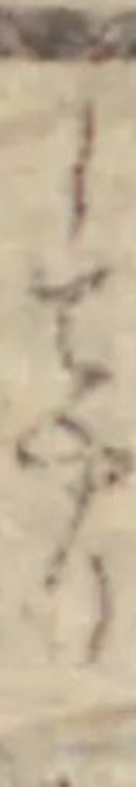してやり
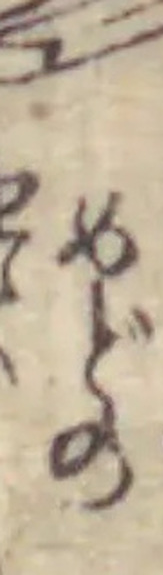めどの
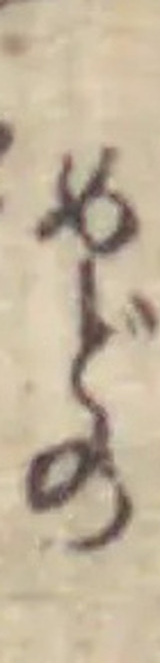めどの
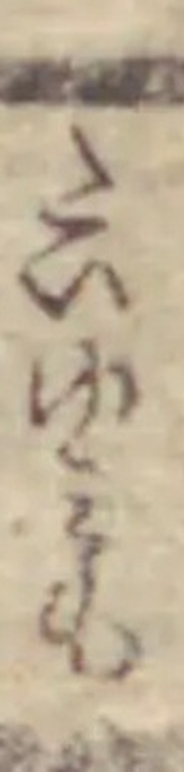たいゆみも
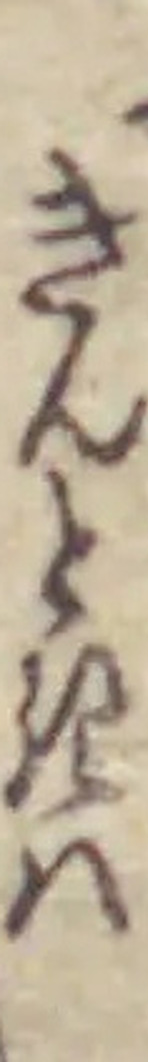きんときは
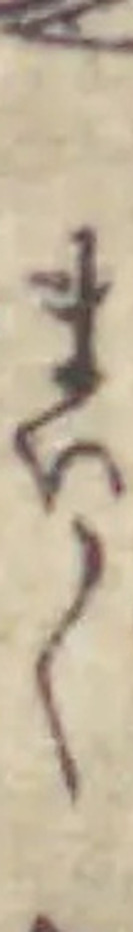まい〳〵
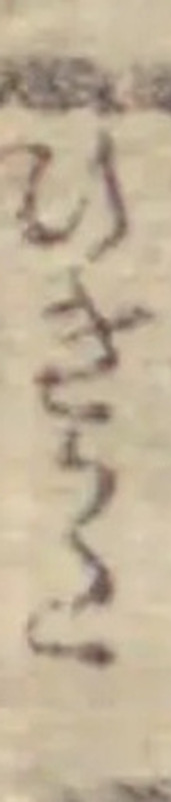ひきかた
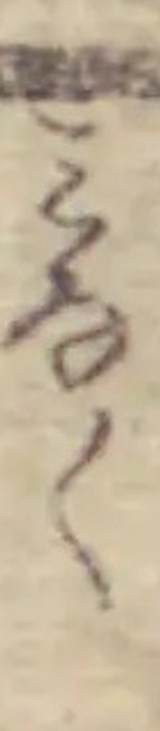みな〳〵
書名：化物敵討 2巻
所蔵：国立国会図書館 National Diet Library, JAPAN
